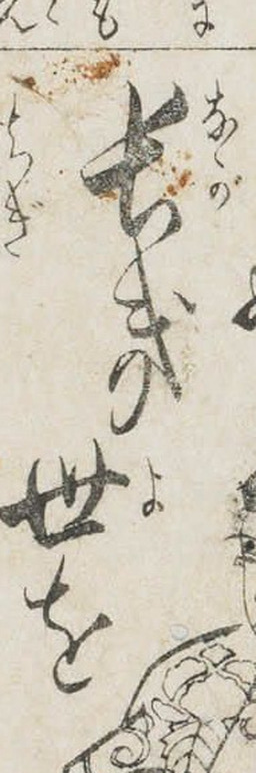長き世を
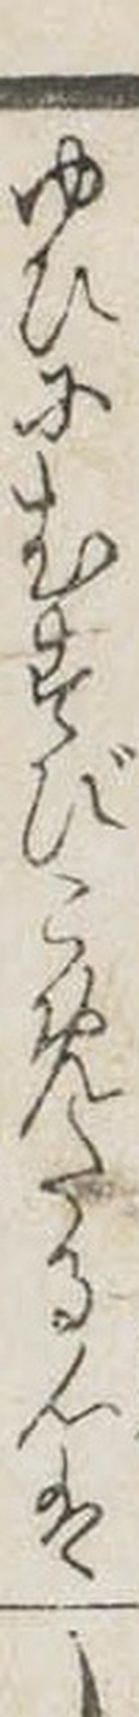ゆひにむすびこめたる心は
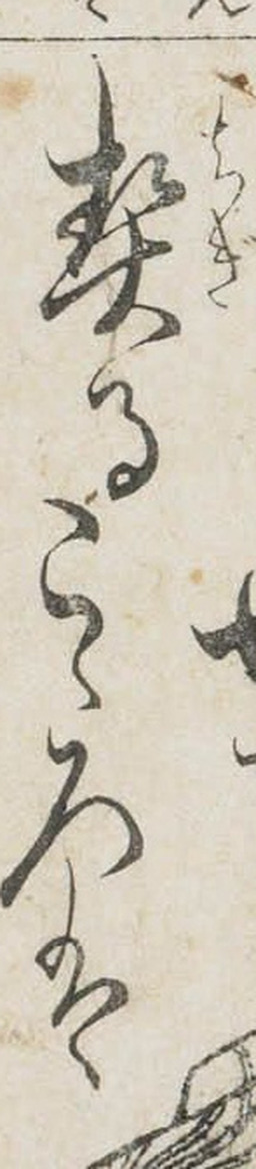契るこゝろは
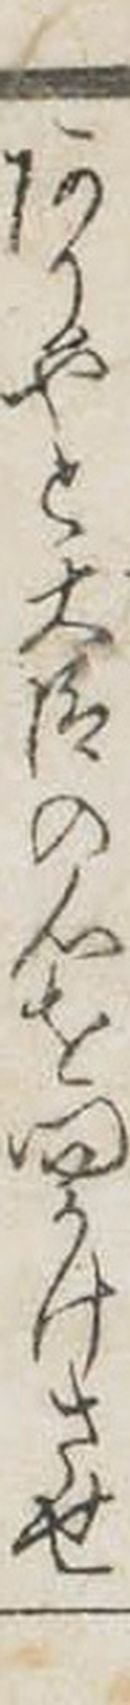ありやと大臣の心を問かけさせ
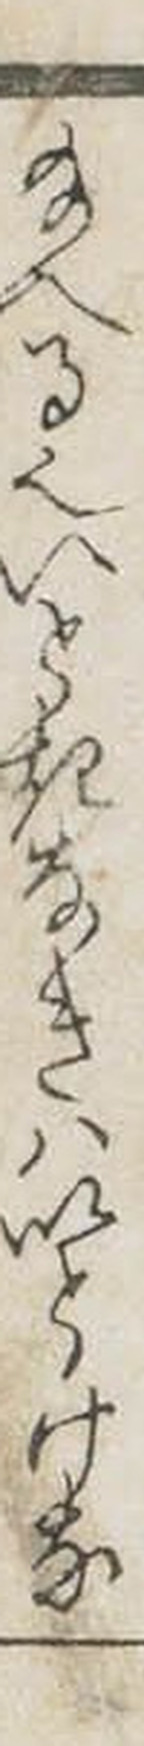給へる也いときなきはいとけな
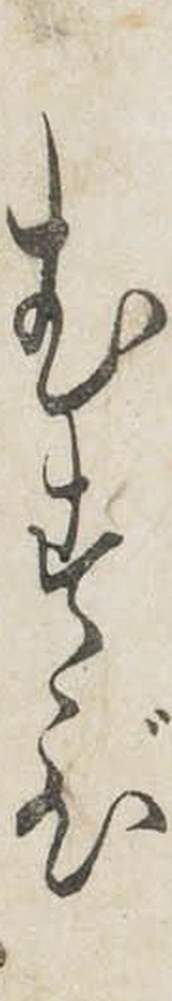むすび
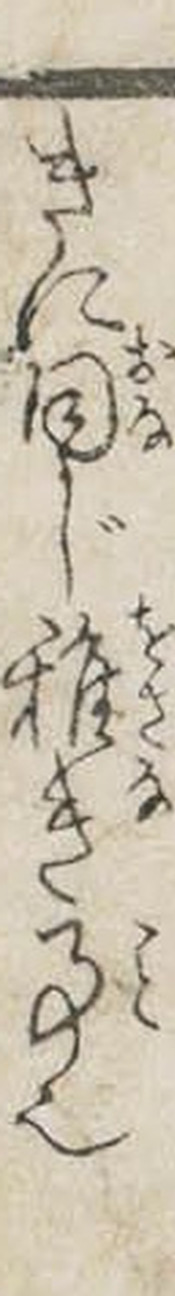きに同じ稚き事也
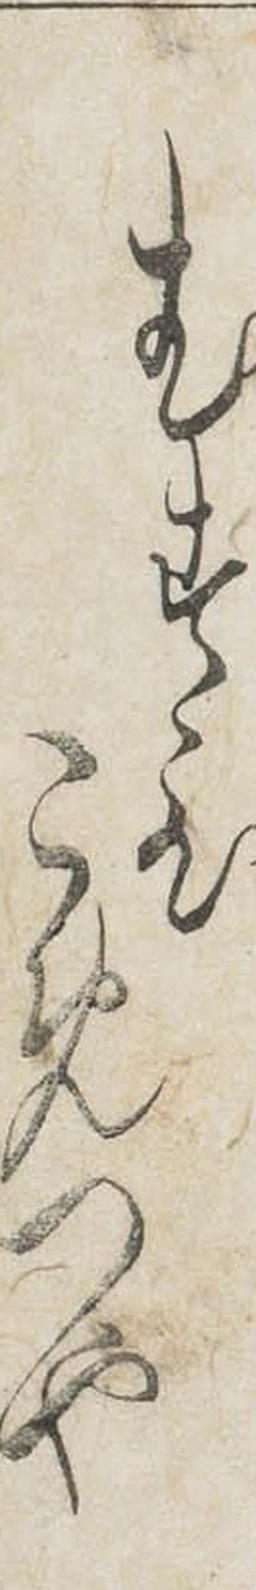こめつや
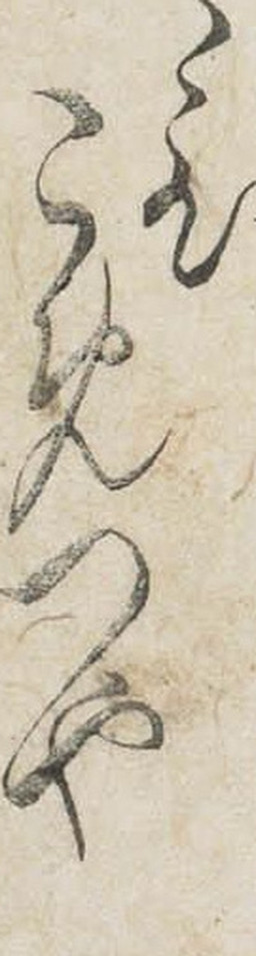こめつや

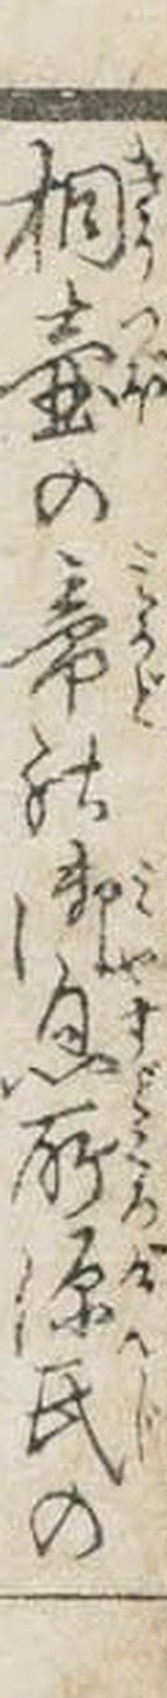桐壺の帝の御息所源氏の
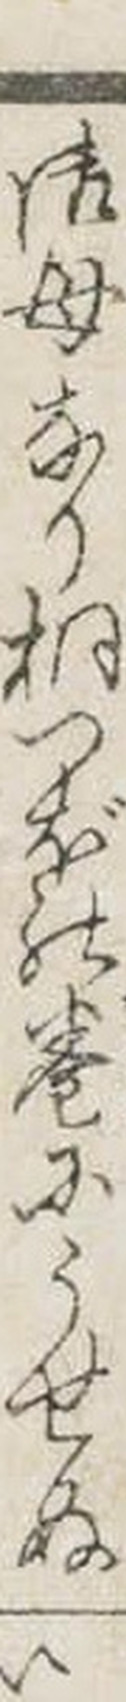御母なり桐つぼの巻にうせぬ
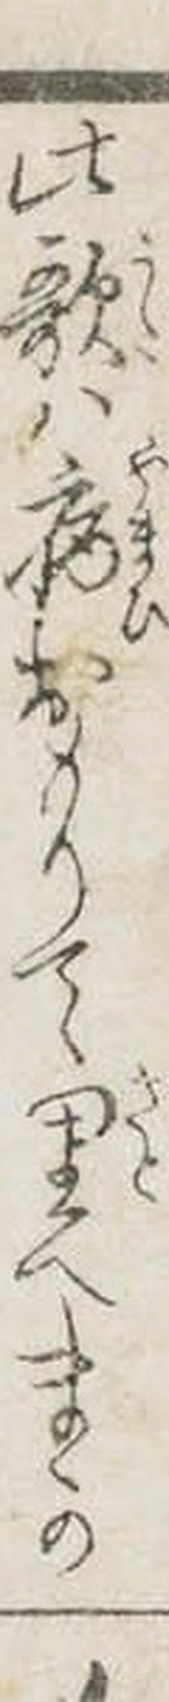此歌は病おのりて里へまか
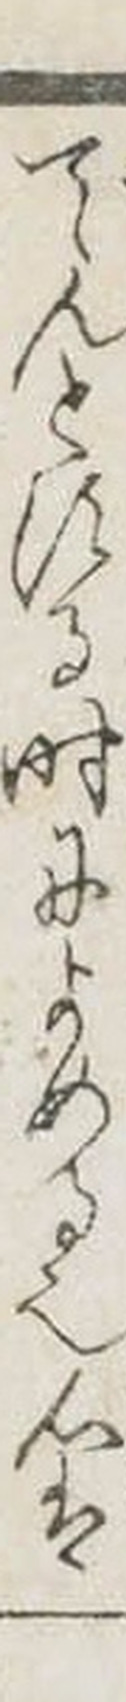でんとする時によめる也心は
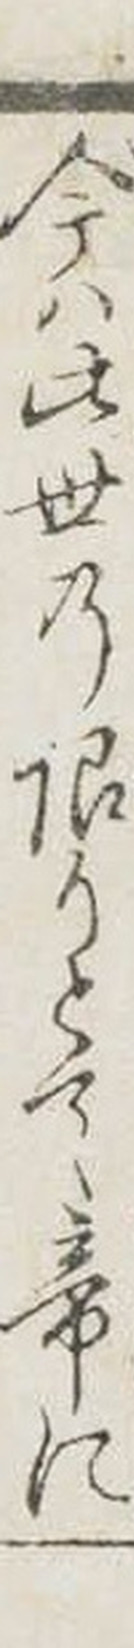今は此世の限りとて帝に
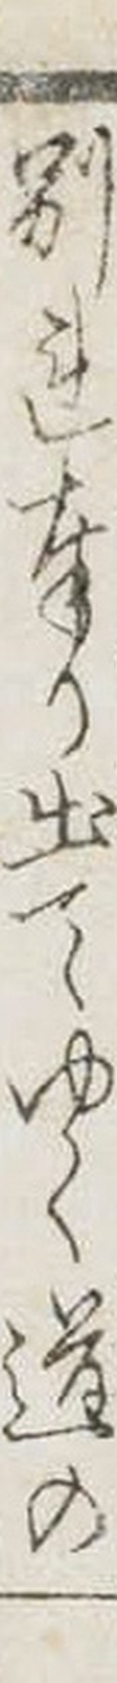別れ奉り出てゆく道の
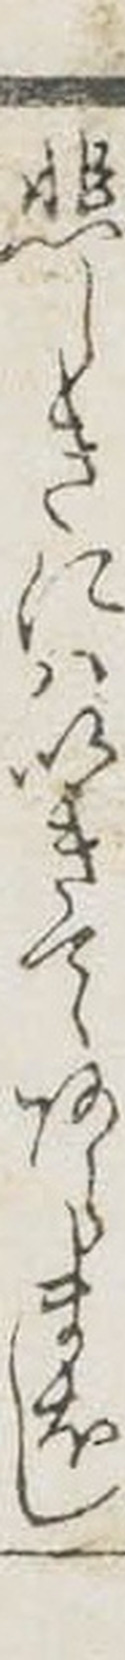悲しきにはいきてあらまほし
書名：源氏百人一首
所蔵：東京学芸大学教育コンテンツアーカイブ
